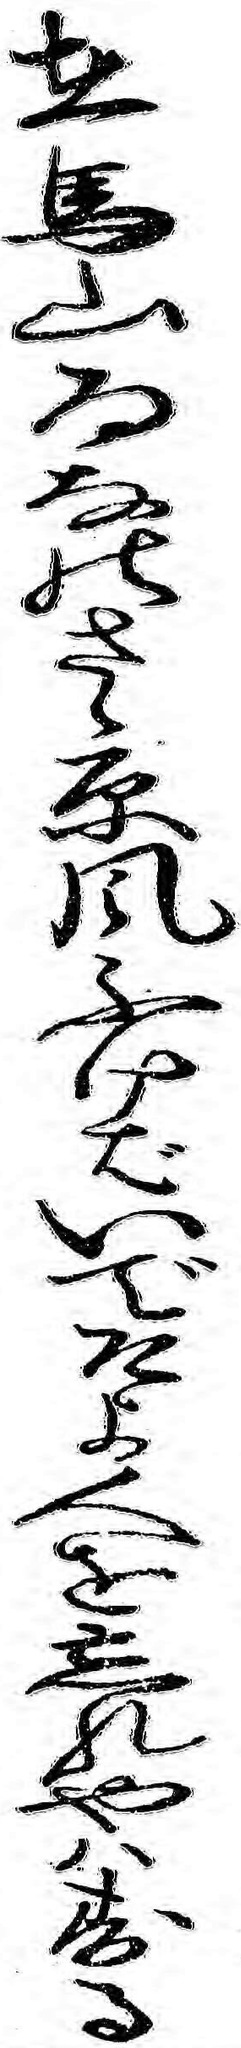在馬山ゐなのさゝ原風ふけばいでそよ人を忘れやはする
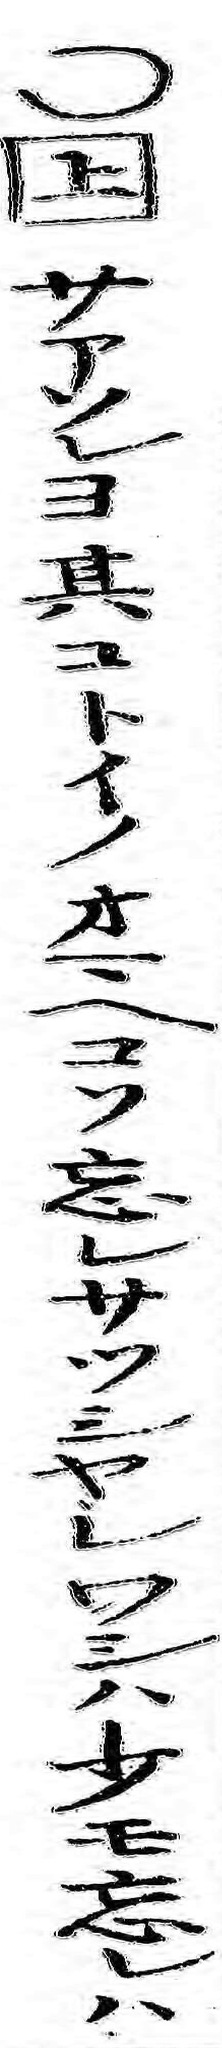○上サアソレヨ其コトイノオマヘコソ忘レサツシヤレワシハ少モ忘レハ
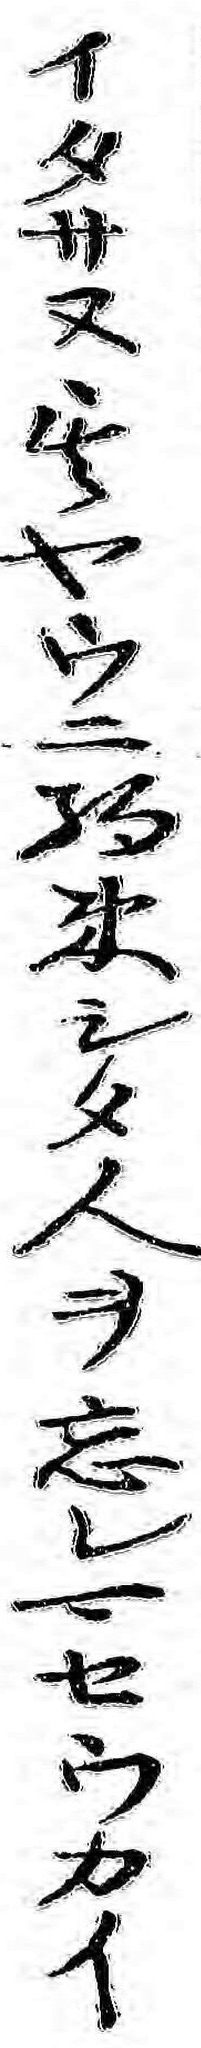イタサヌ其ヤウニ約束シタ人ヲ忘レマセウカイ
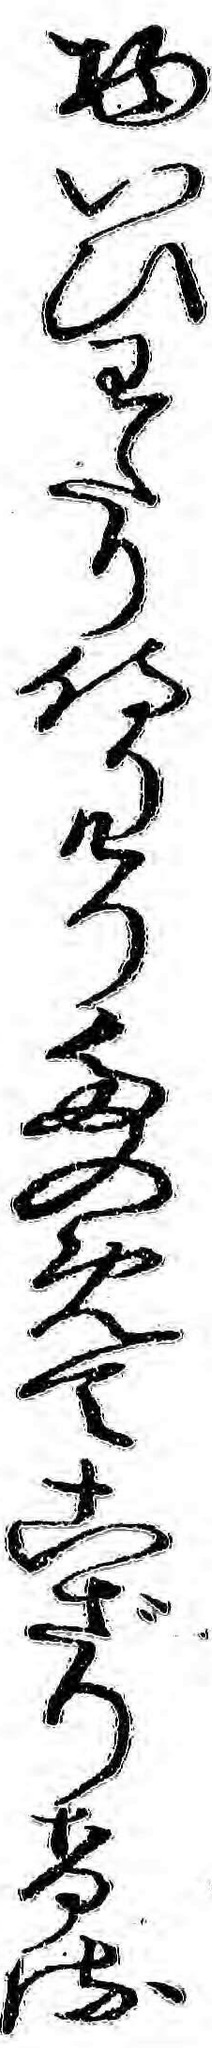物いひわたり侍りけりたのめてこざりける
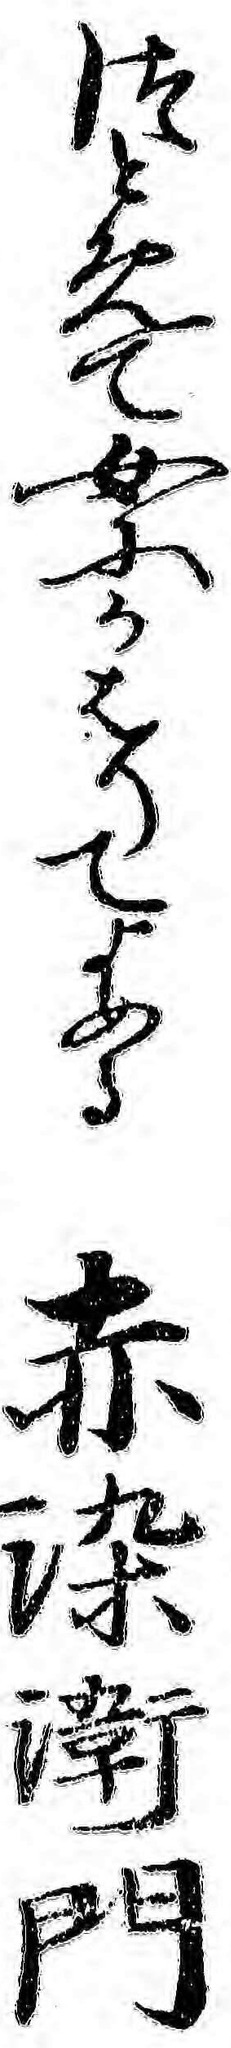つとめて女にかはりてよめる赤染衛門
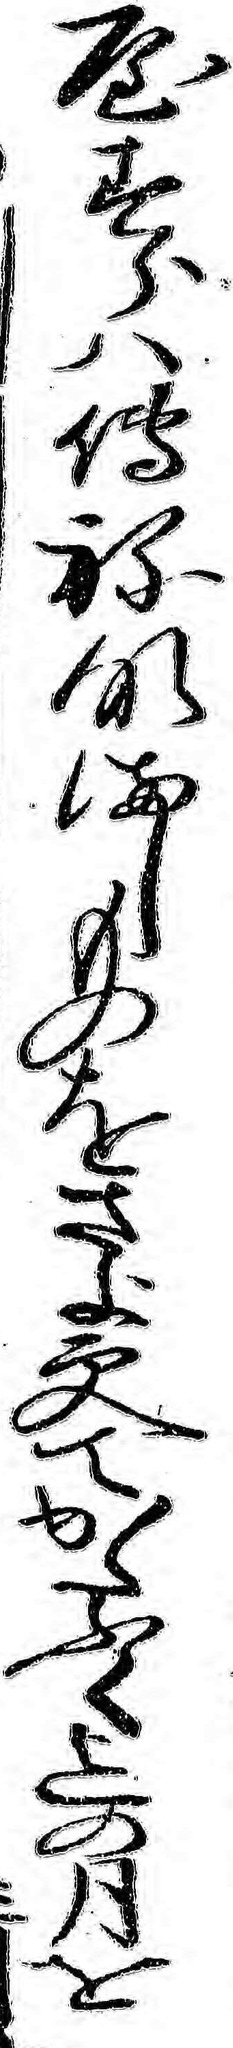やすらはでねなましものをさよ更てかたふく迄の月をみし哉
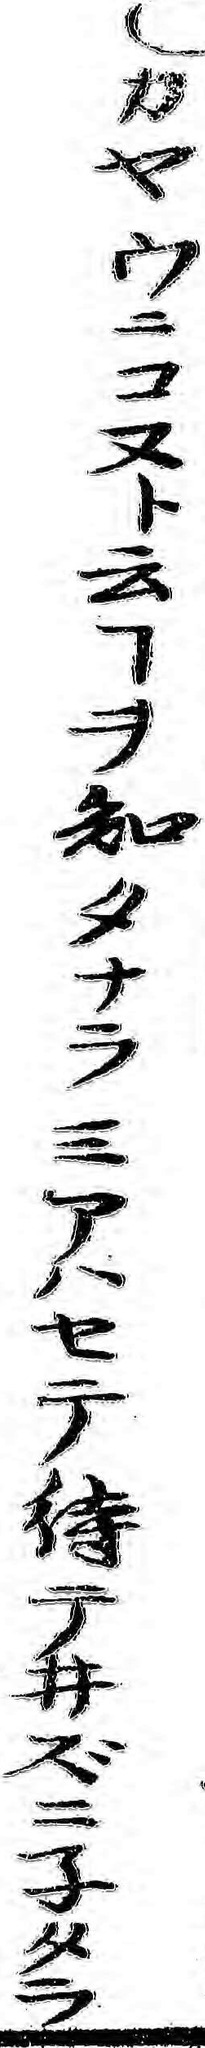○カヤウニコヌト云コトヲ知タナラミアハセテ待テヰズニネタラ
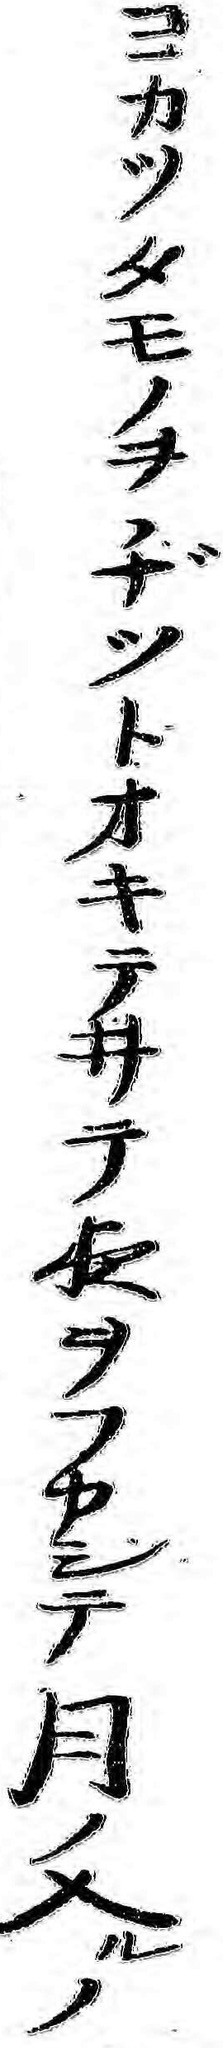ヨカツタモノヲヂツトオキテヰテ夜ヲフカシテ月ノ入ルノ
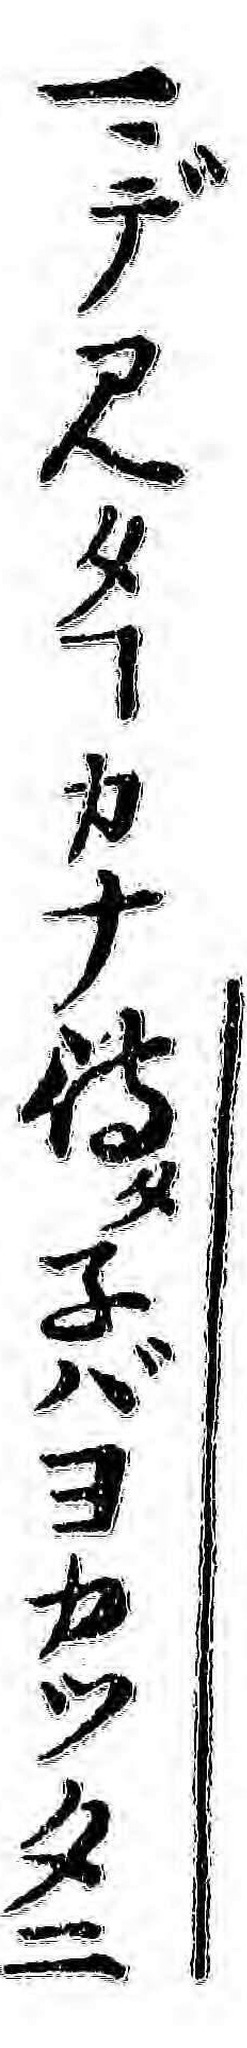マデ見タコトカナ待タネバヨカツタニ
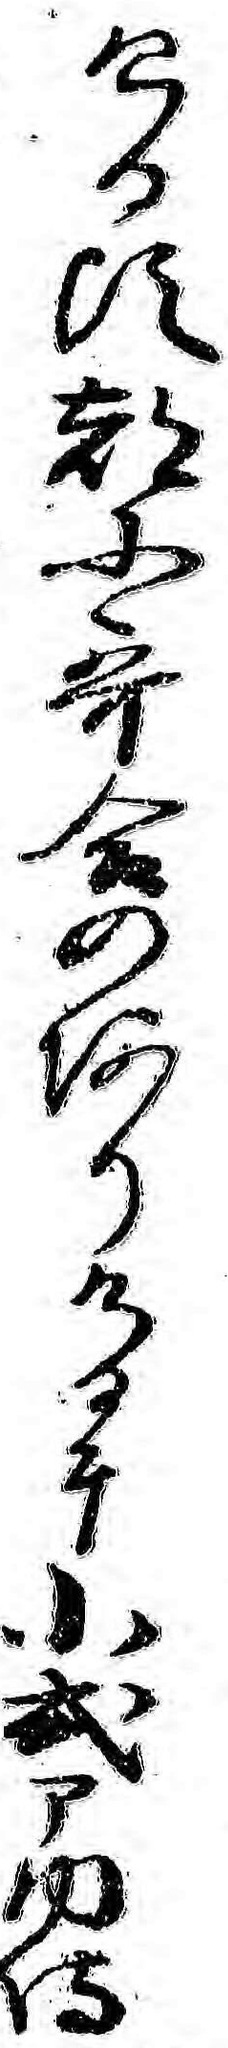ける頃都に哥合のありけるに小式部内侍
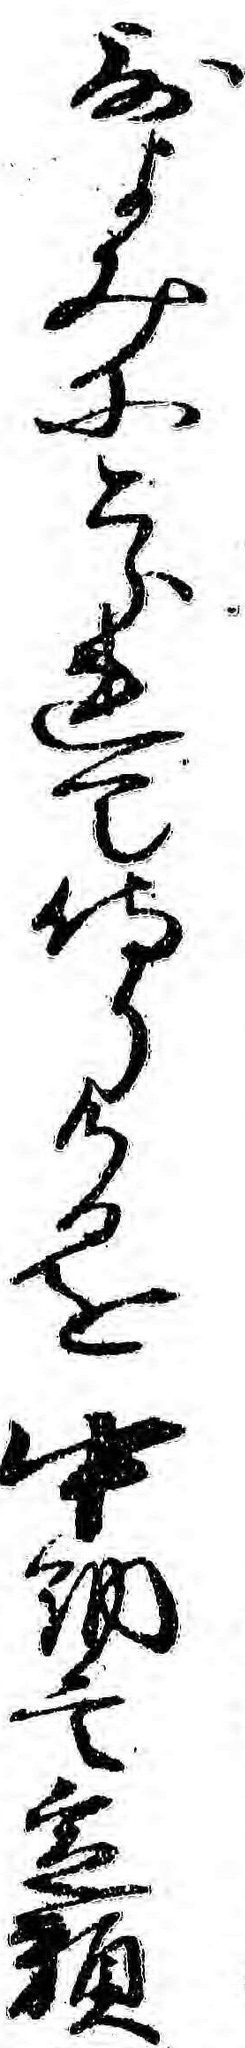哥よみにとられて侍りけるを中納言定頼

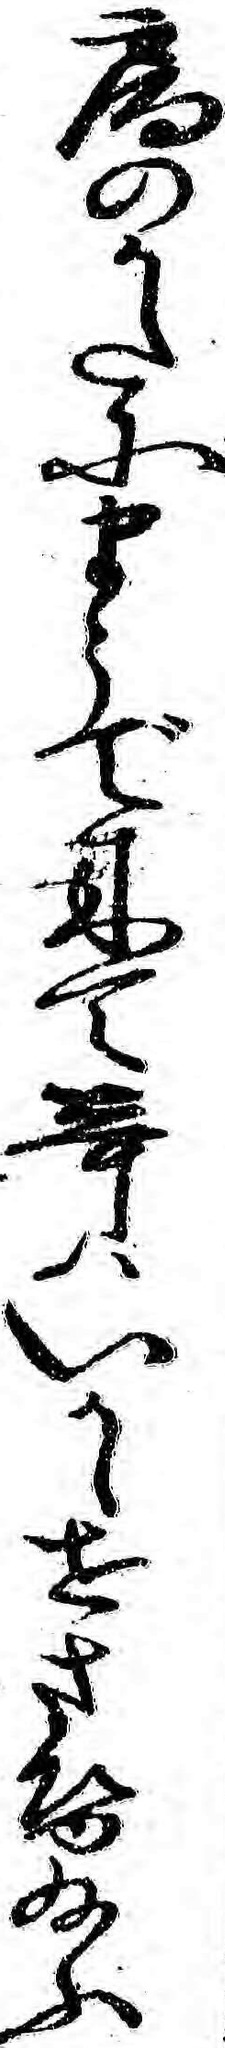局のかたにまうで来て哥はいかゝせさせ給ふ
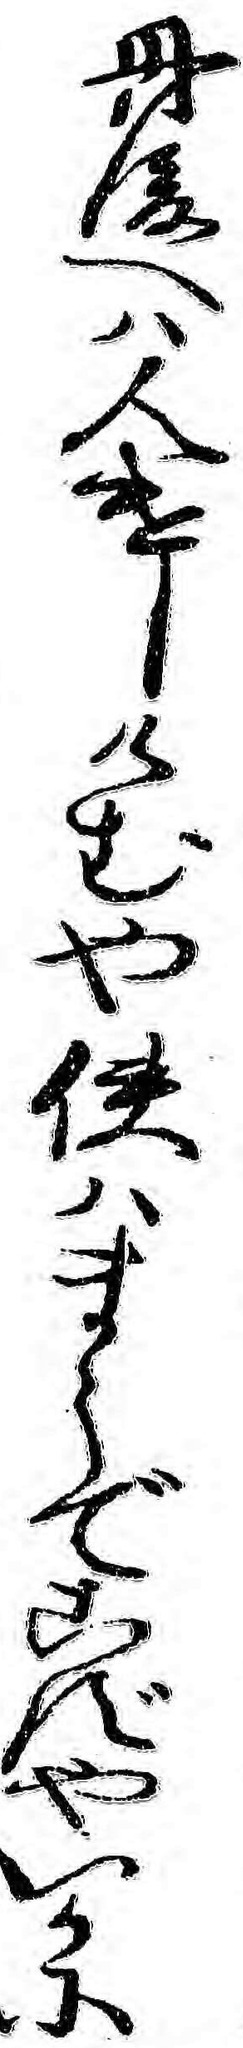丹後へは人遣しけむや使はまうでこずやいかに
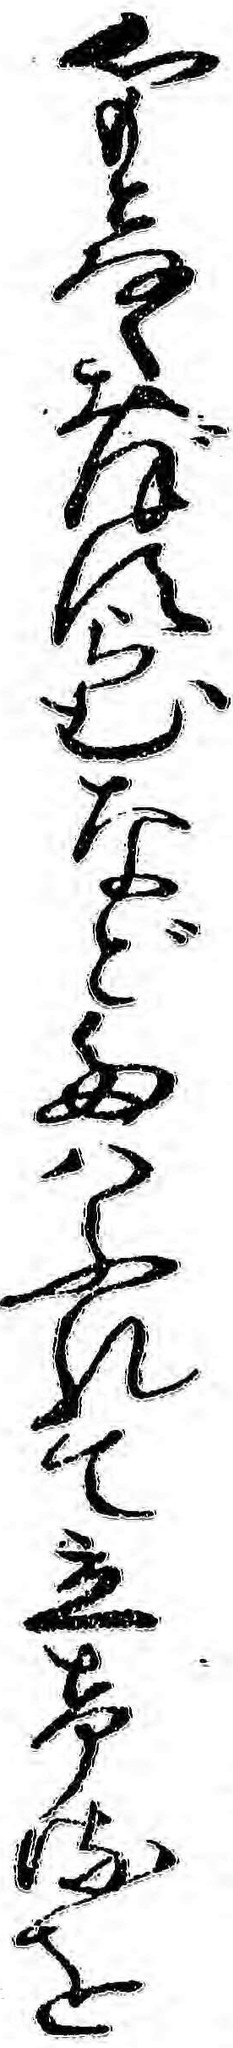心もとなくおぼすらむなどたはふれて立けるを
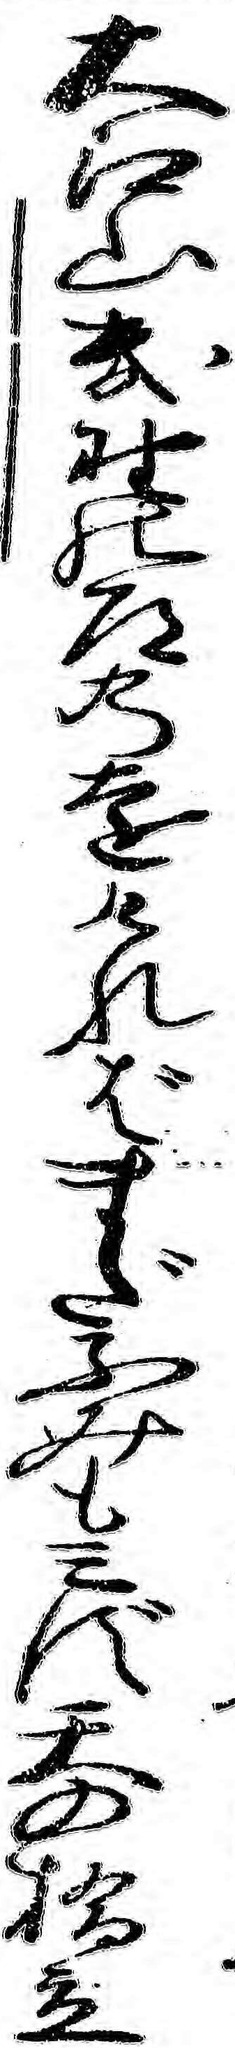大江山幾野の道の遠ければまだふみもみず天の橋立
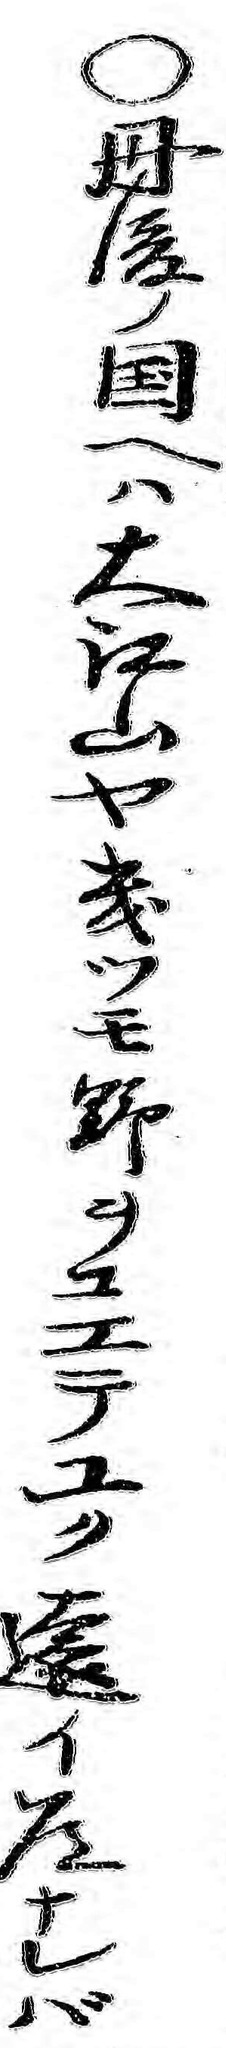○丹後ノ国ヘハ大江山ヤ幾ツモ野ヲコエテユク遠イ道ナレバ
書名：百人一首／小倉の山ふみ
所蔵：国文学研究資料館
